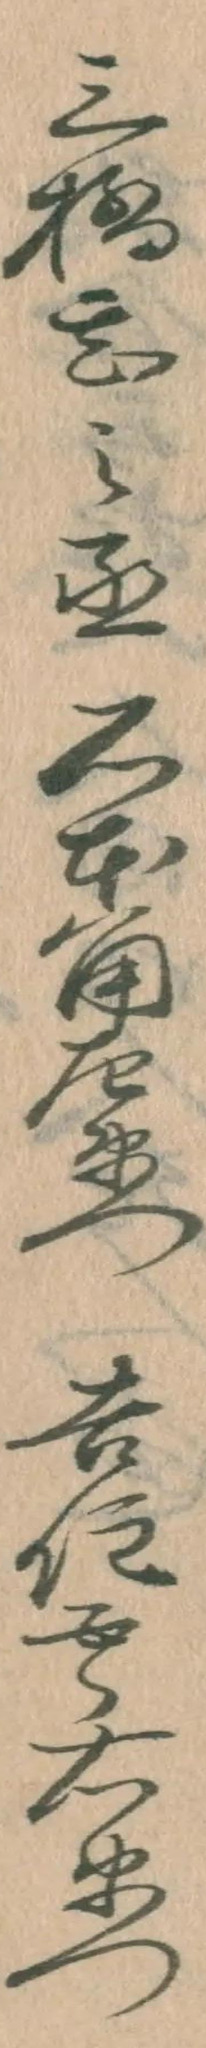三橋甚之丞石本角左衛門吉住五郎右衛門
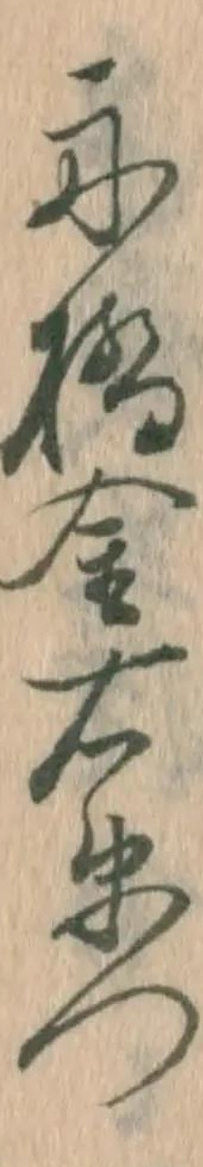舟橋金右衛門
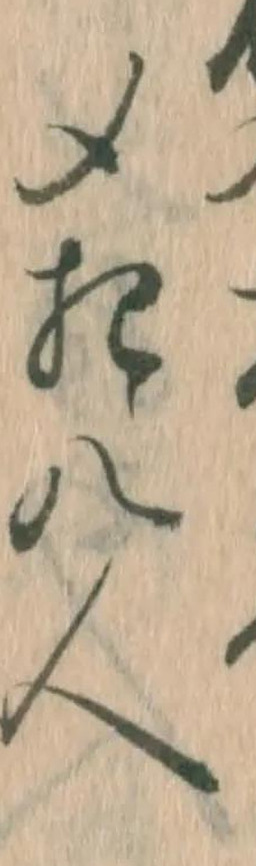〆拾八人
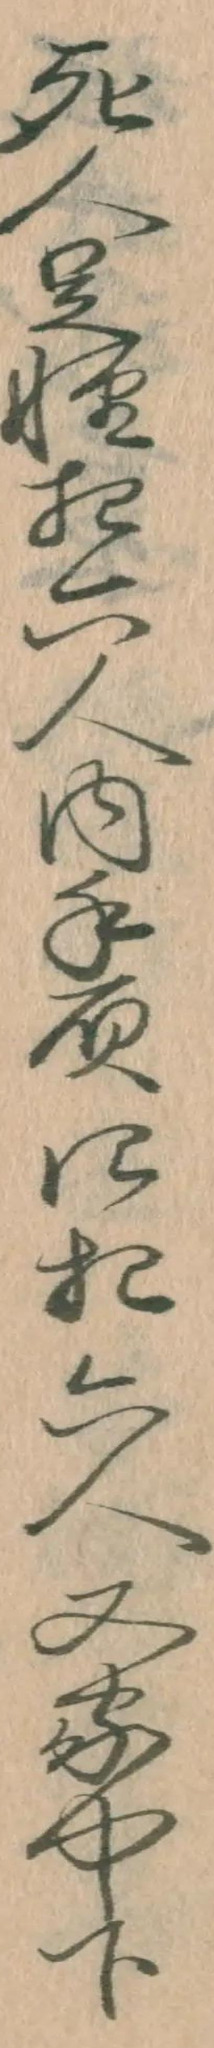死人足軽拾六人内手負四拾六人又家中下
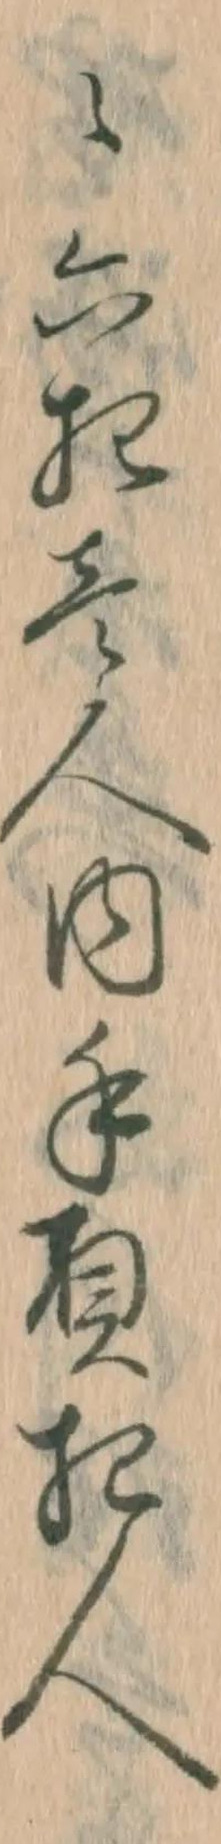々六拾壱人内手負拾人
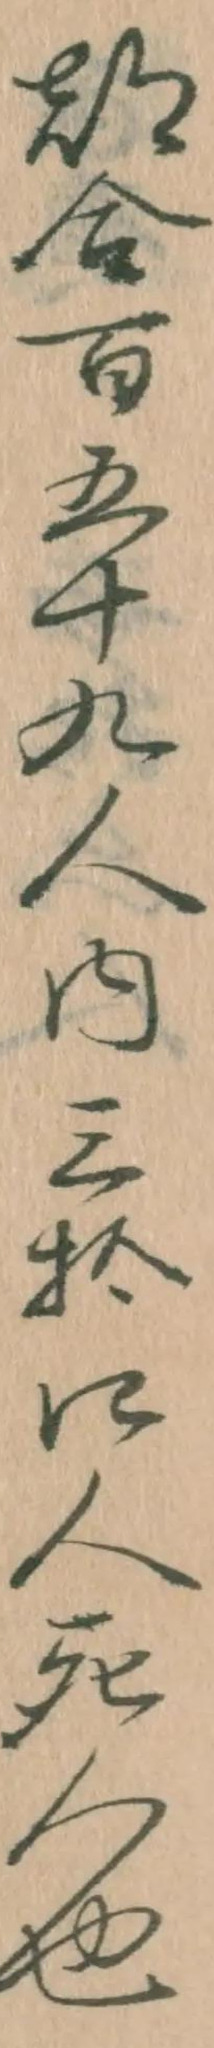都合百五十九人内三拾四人死人也
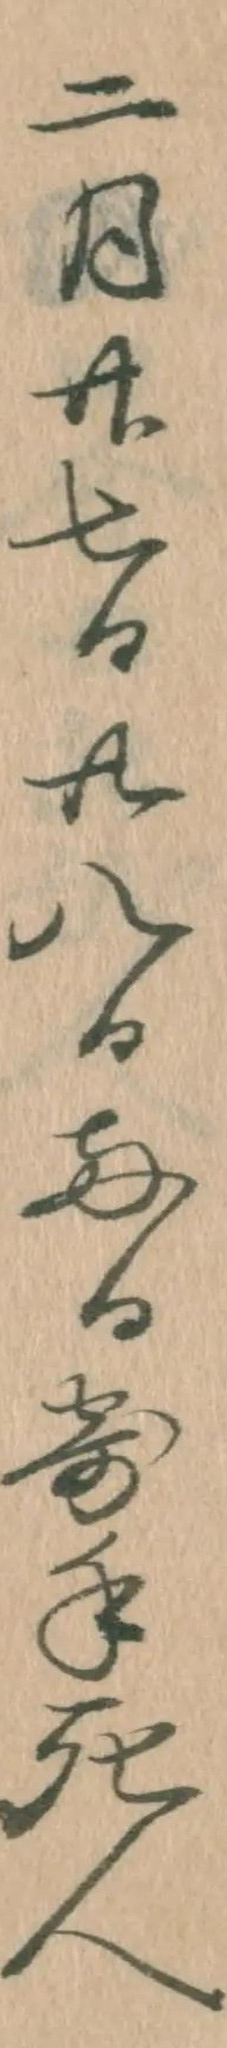二月廿七日廿八日両日寄手死人
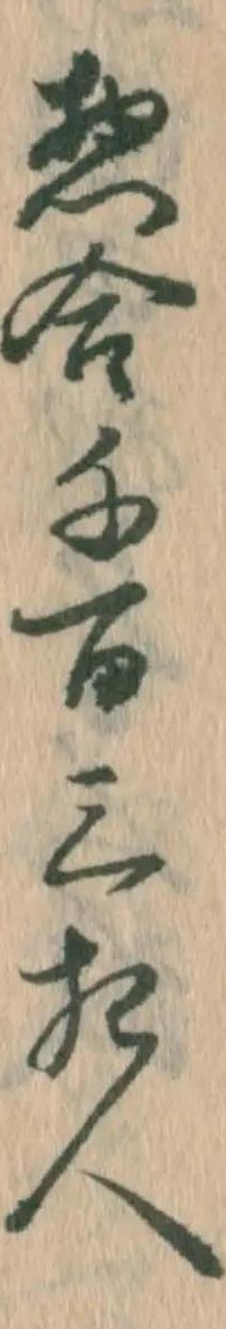惣合千百三拾人
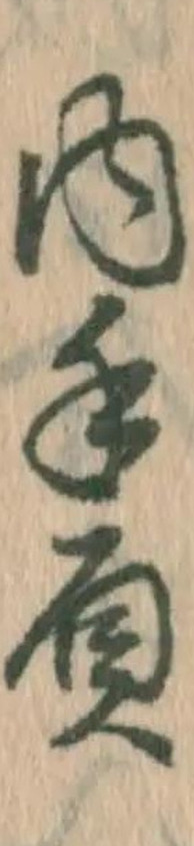内手負
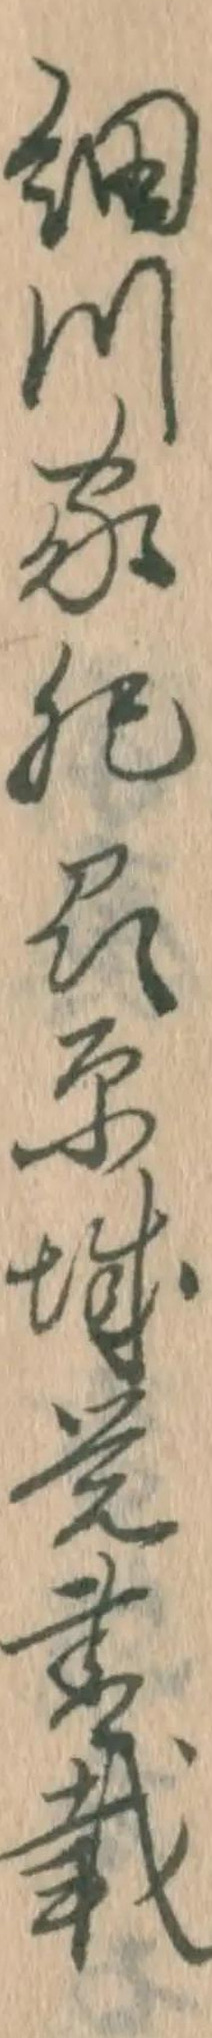細川家肥州原城覚書載
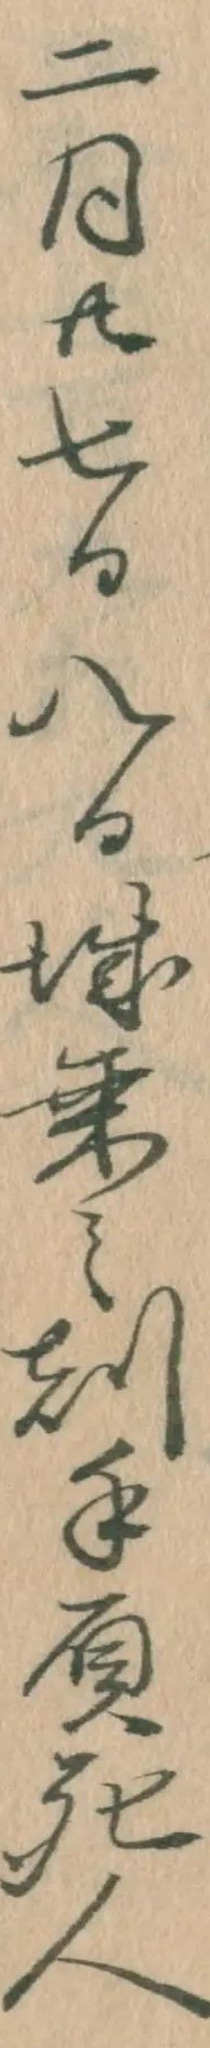二月廿七日八日城乗之刻手負死人
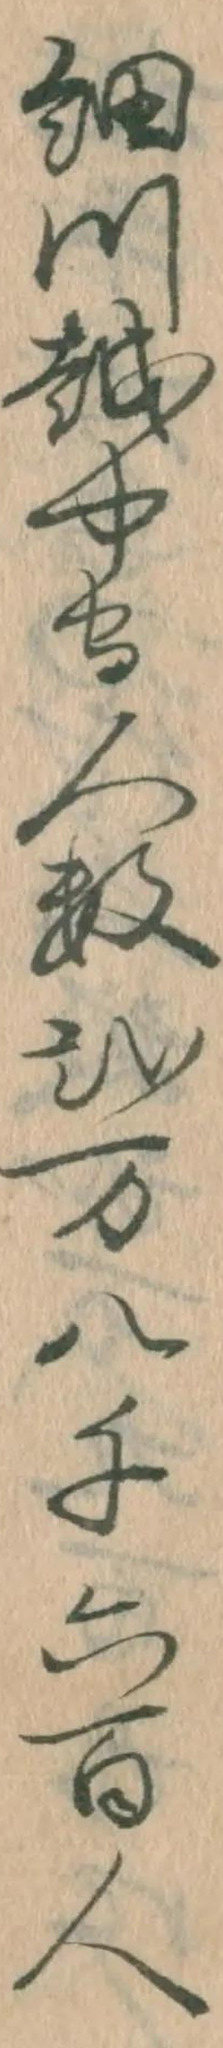細川越中守人数弐万八千六百人
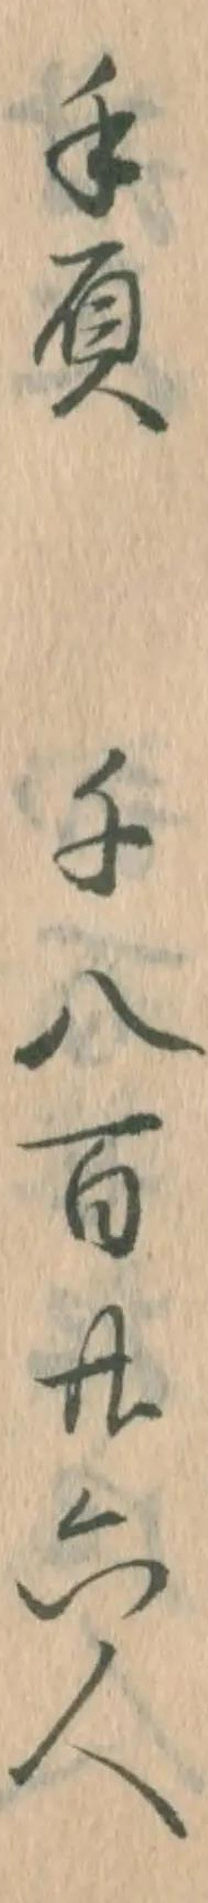手負千八百廿六人

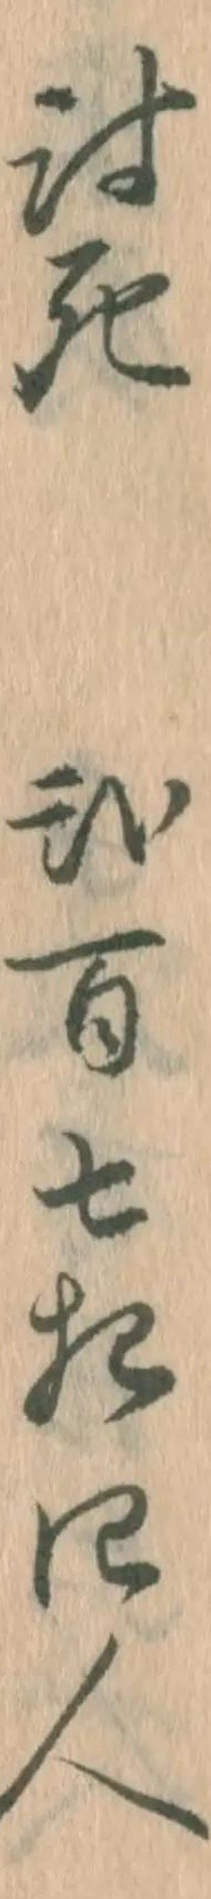討死弐百七拾四人
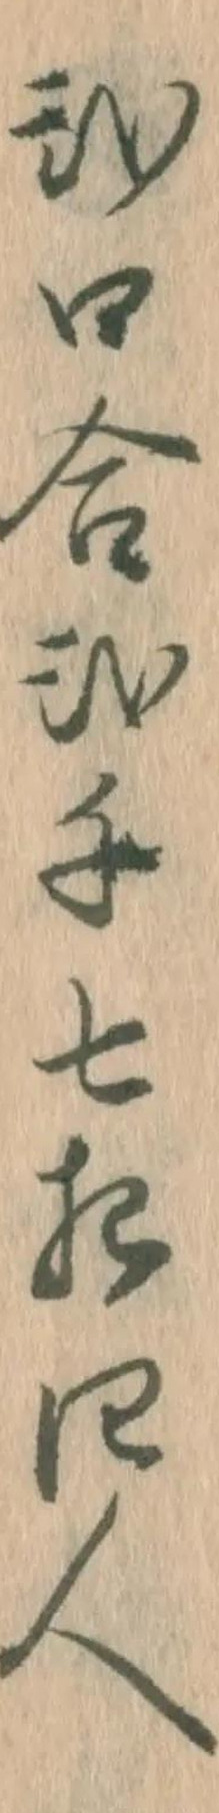弐口合弐千七拾四人
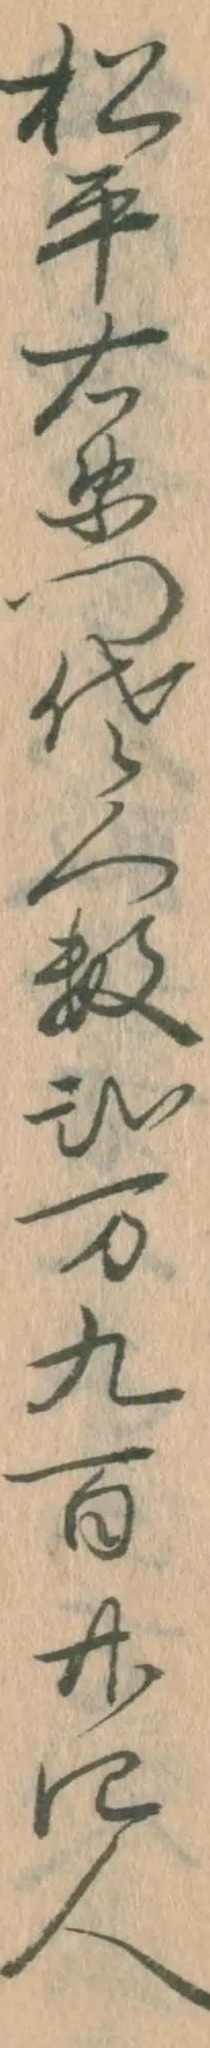松平右衛門佐人数弐万九百廿四人
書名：切支丹御退治記 49巻. [9]
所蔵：国立国会図書館 National Diet Library, JAPAN
